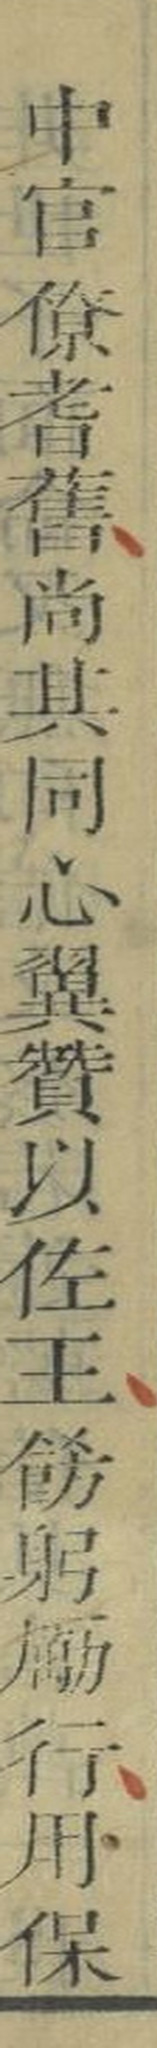中官僚耆旧尚其同心翼賛以佐王餝躬励行用保
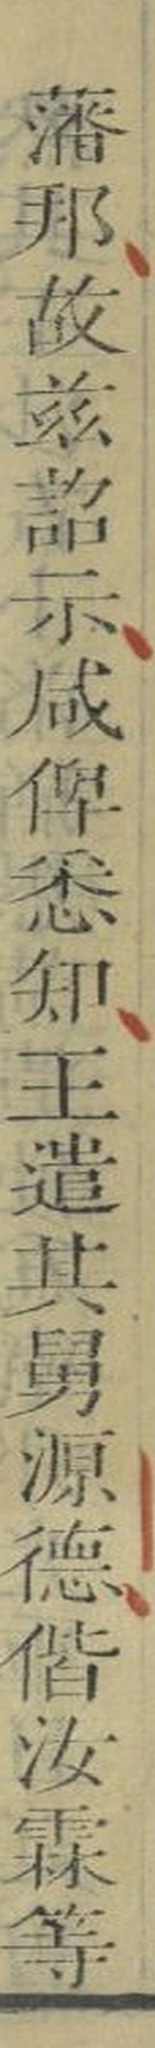藩邦故茲詔示咸俾悉知王遣其舅源徳偕汝霖等
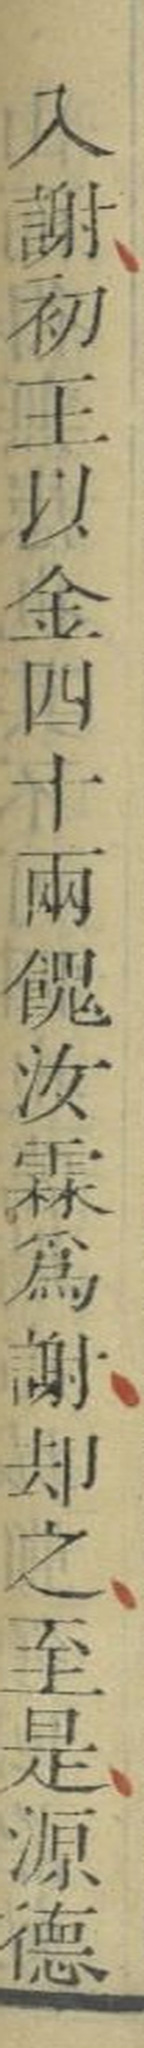入謝初王以金四十両餽汝霖為謝却之至是源徳
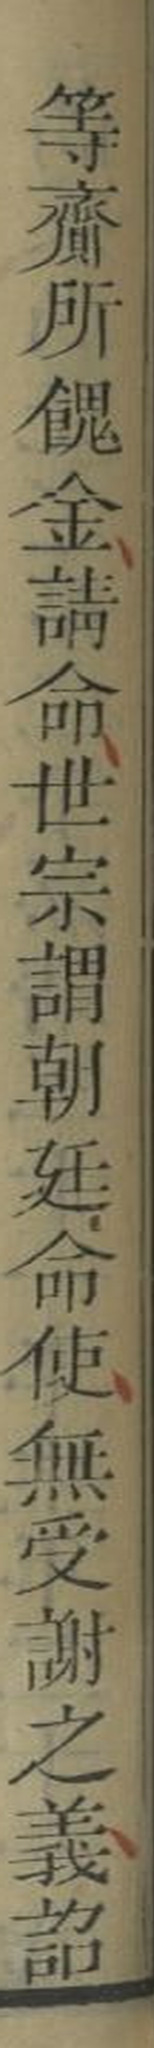等齎所餽金請命世宗謂朝廷命使無受謝之義詔
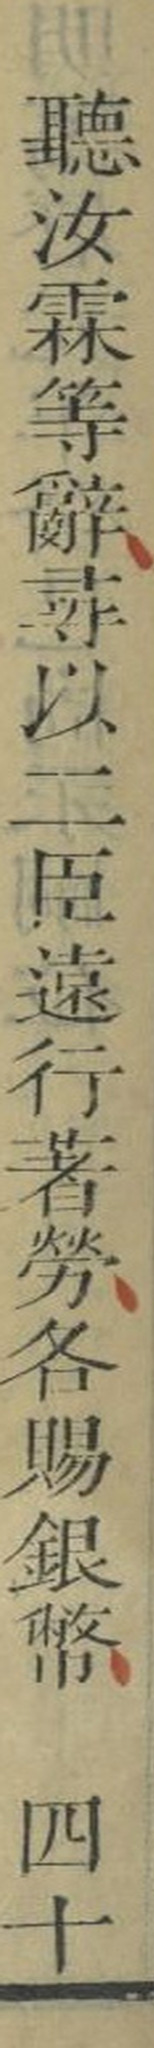聴汝霖等辞尋以二臣遠行著労各賜銀幣四十
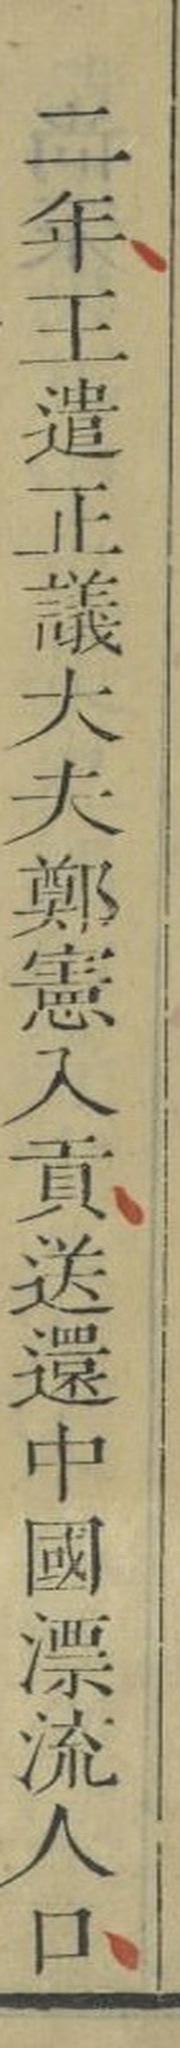二年王遣正議大夫鄭憲入貢送還中国漂流人口
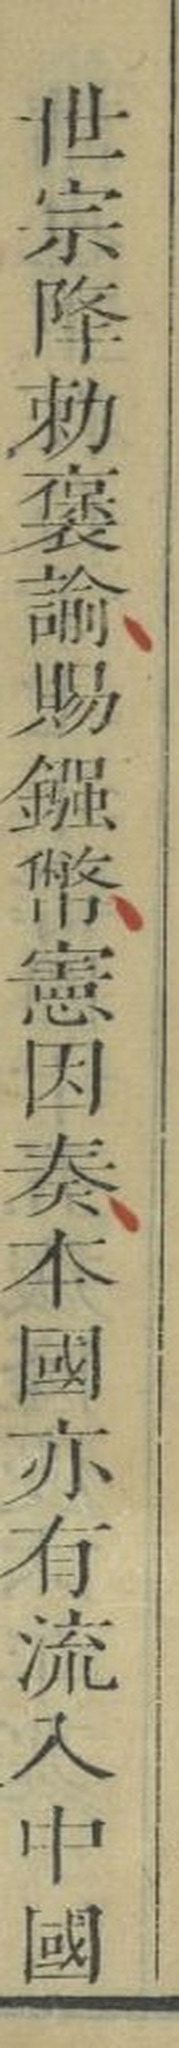世宗降勅褒諭賜鏹幣憲因奏本国亦有流入中国
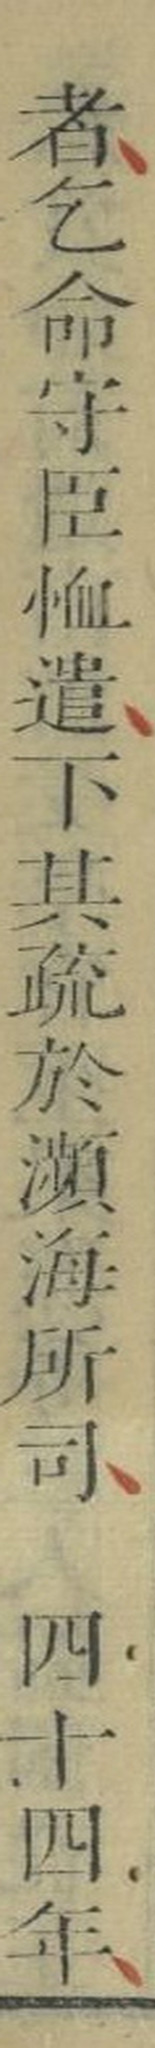者乞命守臣恤遣下其疏於瀕海所司四十四年
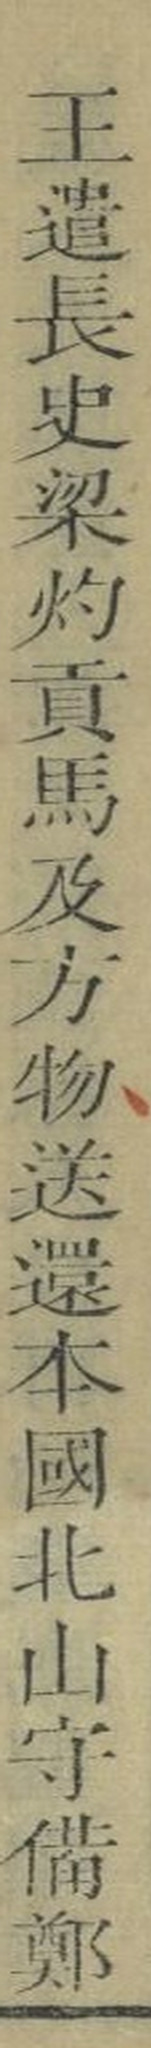王遣長史梁灼貢馬及方物送還本国北山守備鄭
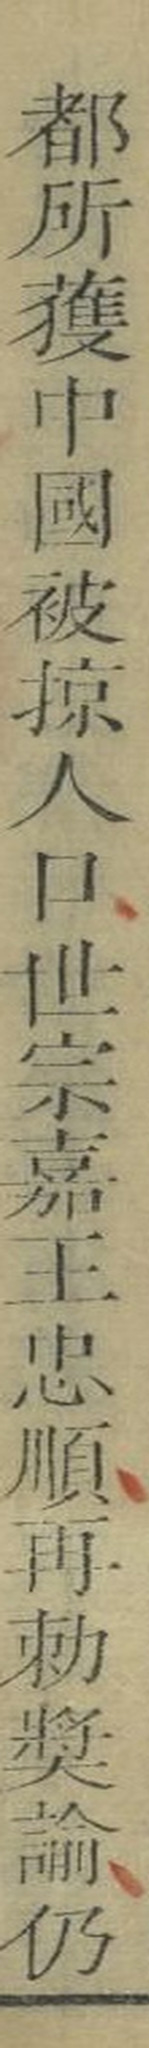都所獲中国被掠人口世宗嘉王忠順再勅奨諭仍
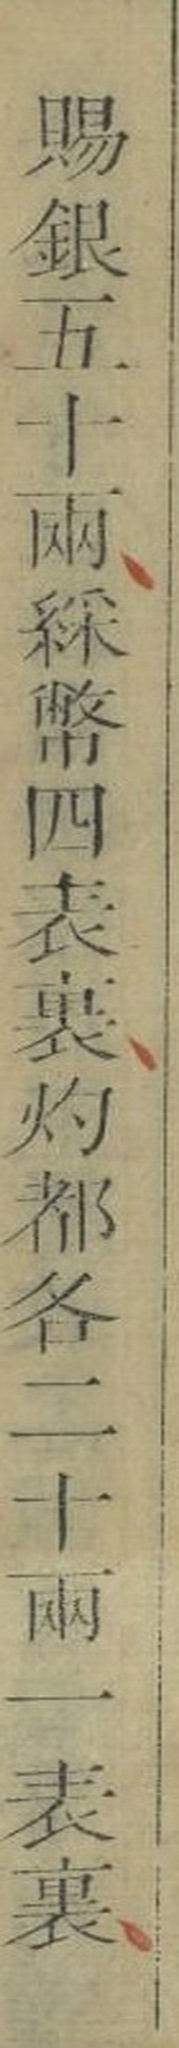賜銀五十両綵幣四表裏灼都各二十両一表裏
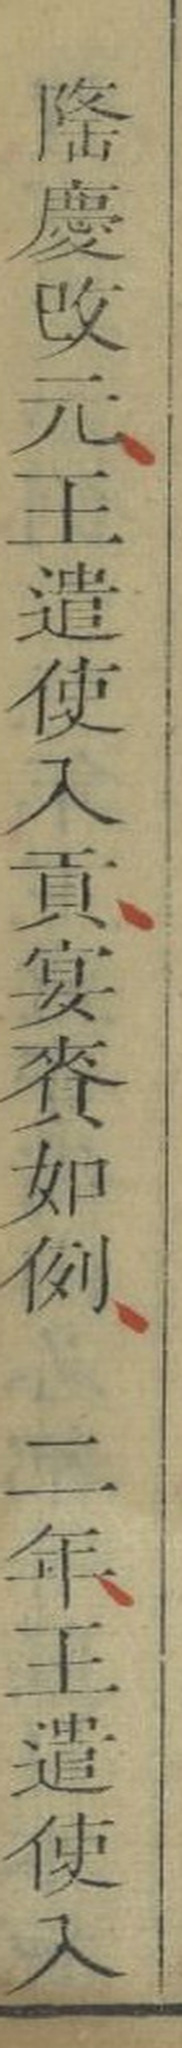慶改元王遣使入貢宴賚如例二年王遣使入

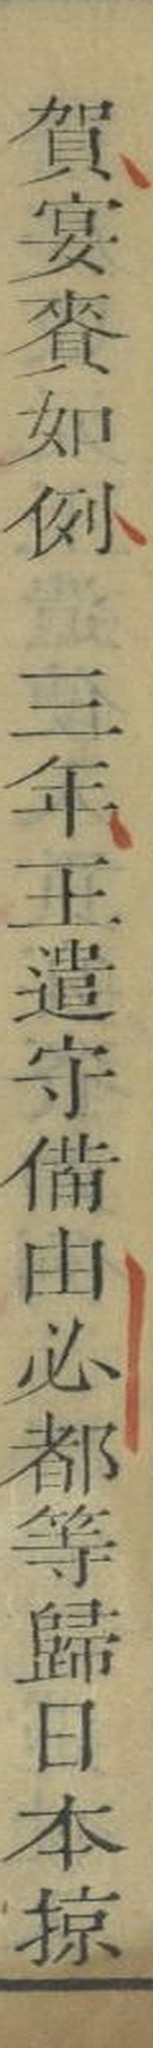賀宴賚如例三年王遣守備由必都等帰日本掠
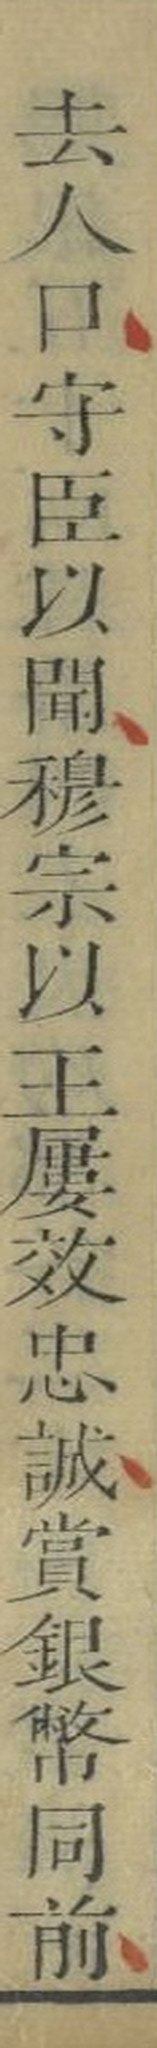去人口守臣以聞穆宗以王屢效忠誠賞銀幣同前
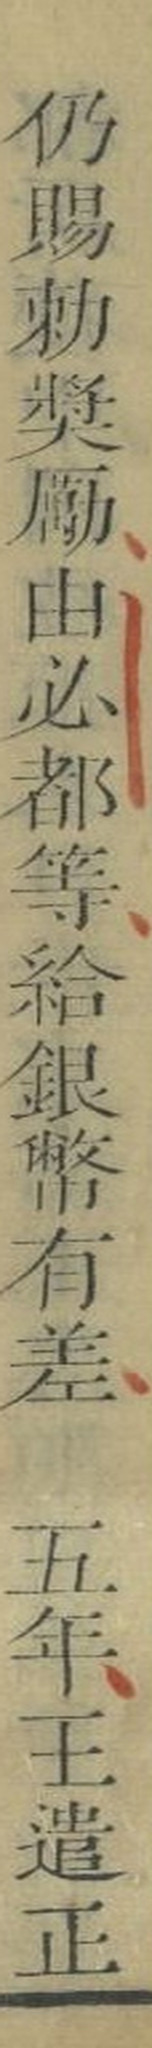仍賜勅奨励由必都等給銀幣有差五年王遣正
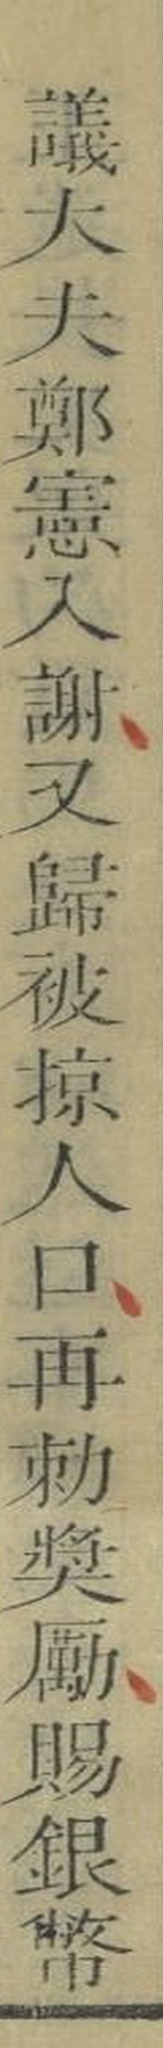議大夫鄭憲入謝又帰被掠人口再勅奨励賜銀幣
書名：中山伝信録 巻三
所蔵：University of the Ryukyus Library
